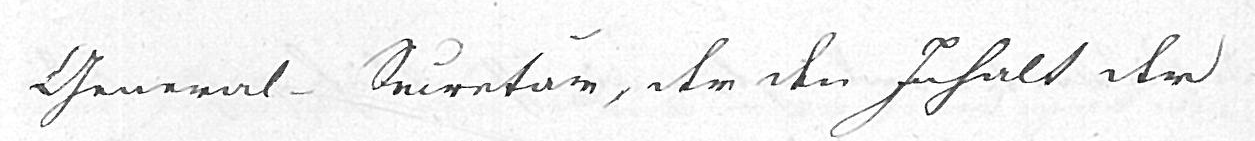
General-Secretär, der den Inhalt der
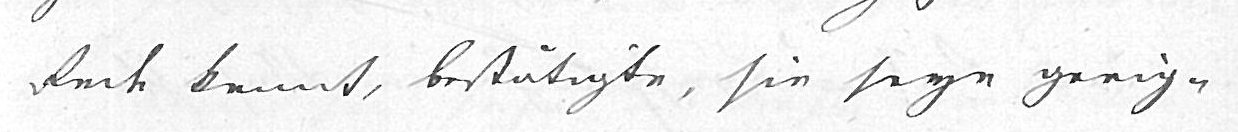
Rede kennt, bestätigte, sie seye geeig-
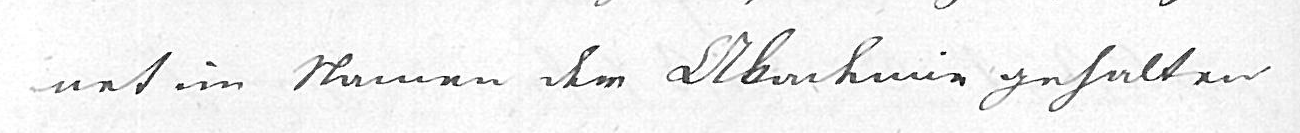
net im Namen der Akademie gehalten
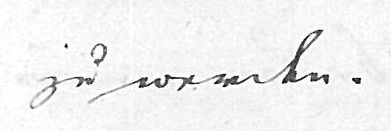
zu werden.
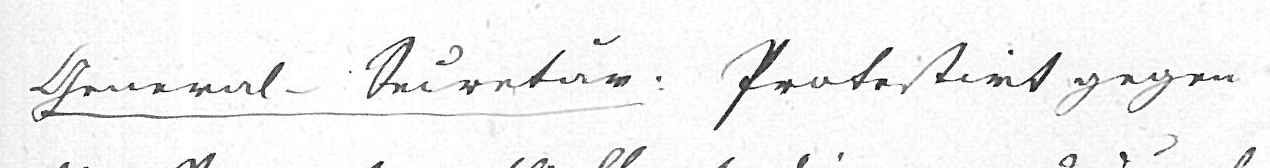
General-Secretär: Protestirt gegen
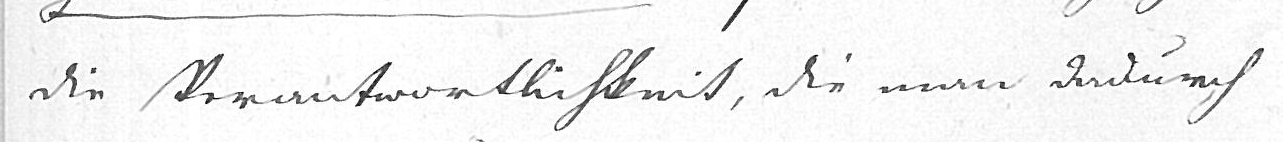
die Verantwortlichkeit, die man dadurch
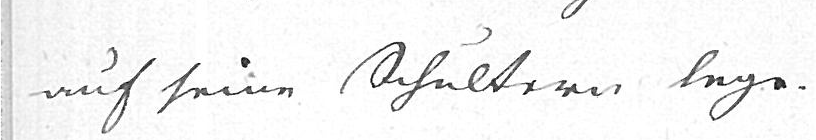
auf seine Schultern lege.
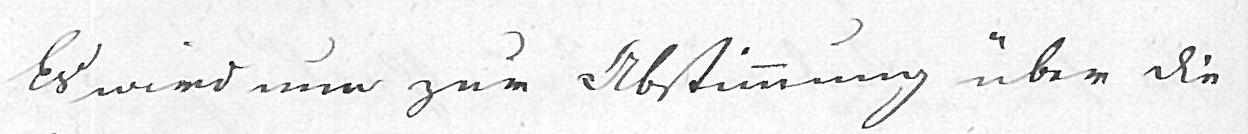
Es wird nun zur Abstimmung über die
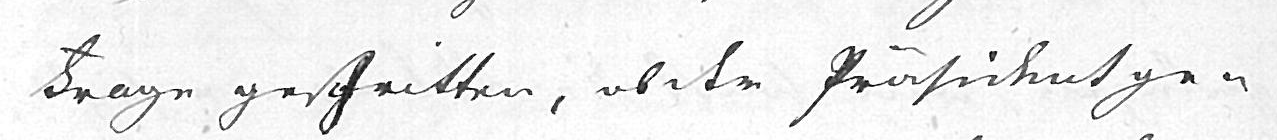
Frage geschritten, ob der Präsident ge-
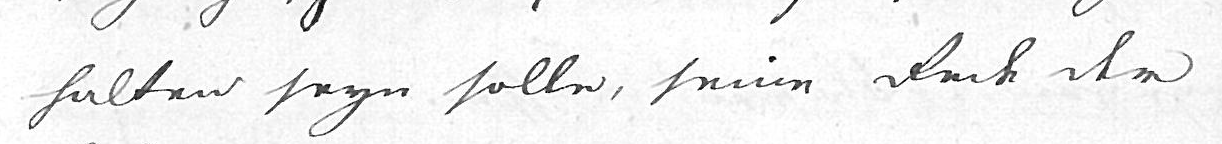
halten seyn solle, seine Rede der
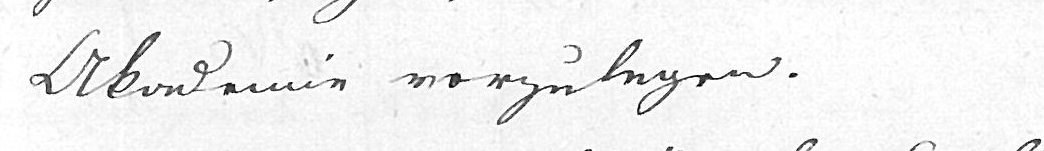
Akademie vorzulegen.
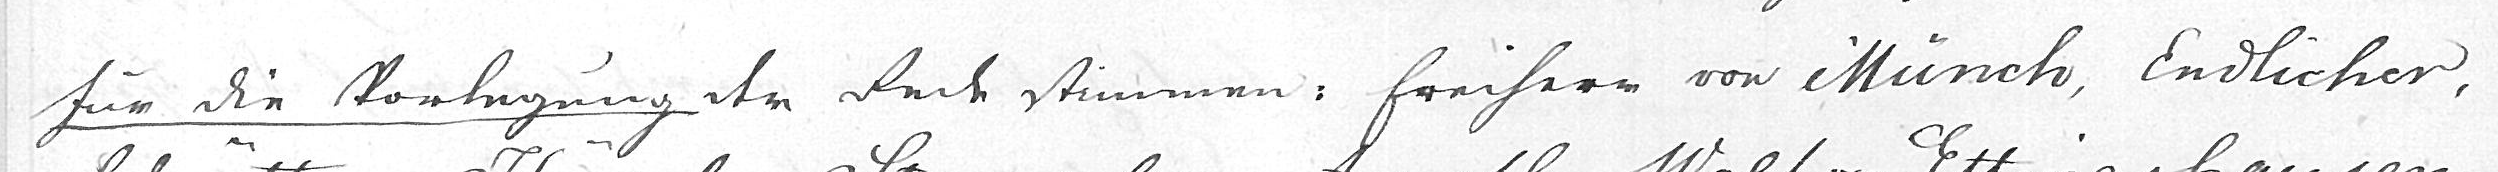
Für die Vorlegung der Rede stimmen: Freiherr von Münch, Endlicher,
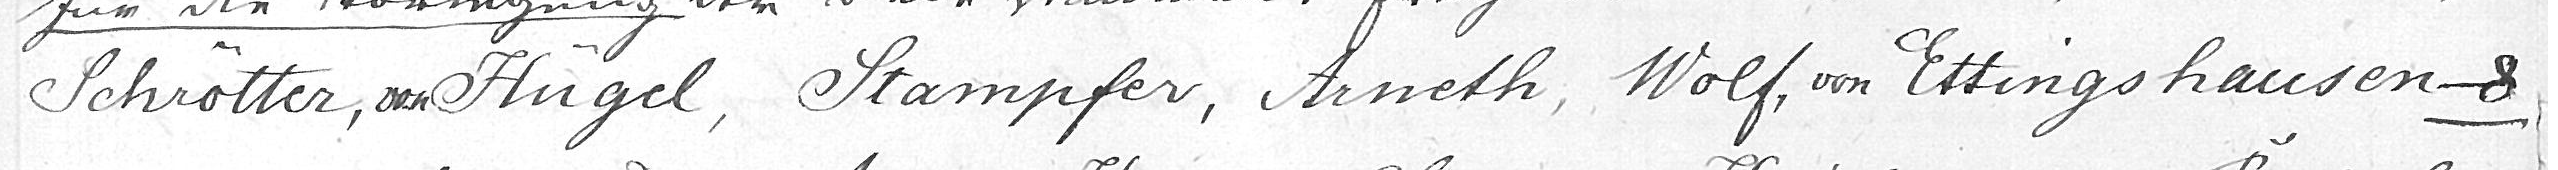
Schrötter, von Hügel, Stampfer, Arneth, Wolf, von Ettingshausen - 8
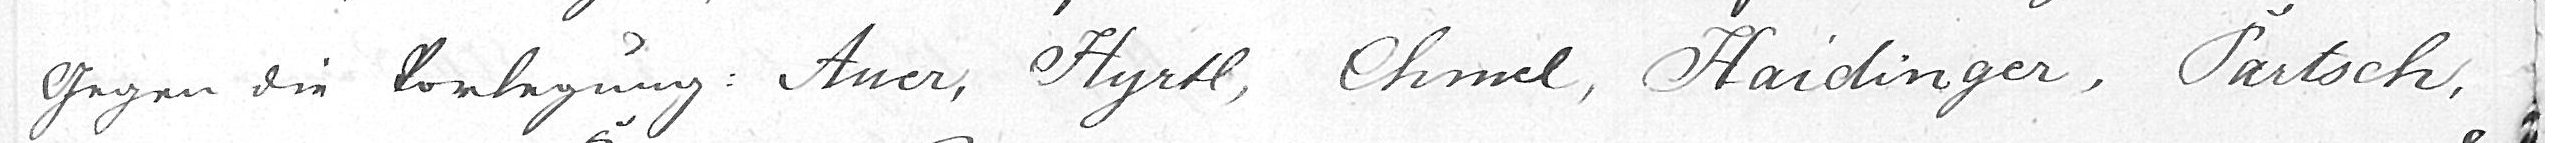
Gegen die Vorlegung: Auer, Hyrtl, Chmel, Haidinger, Partsch,
